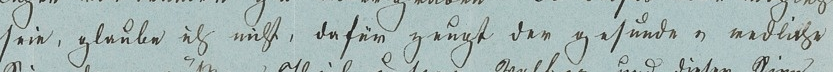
seie, glaube ich nicht, dafür zeugt der gesunde & redliche
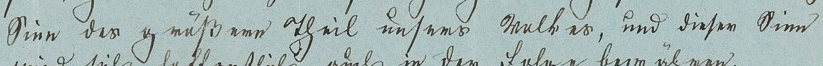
Sinn des größern Theil unsers Volkes, und dieser Sinn
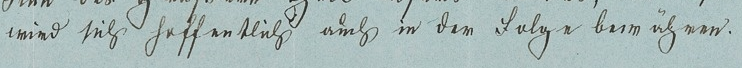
wird sich hoffentich auch in der Folge bewähren.
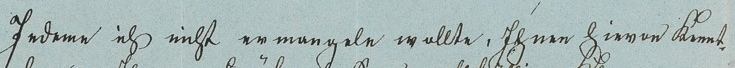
Indeme ich nicht ermangeln wollte, Ihnen hievon Kennt-
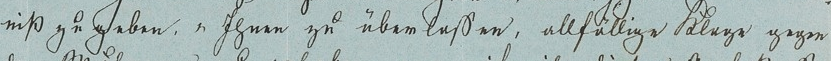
niß zu geben, & Ihnen zu überlassen, allfällige Klage gegen
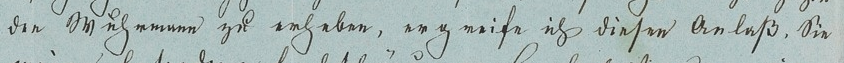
den Wuhrmann zu erheben, ergreife ich diesen Anlaß, Sie
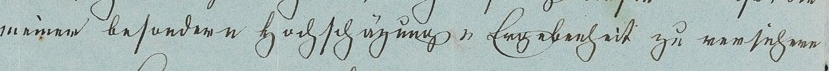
meiner besondern Hochschätzung & Ergebenheit zu versichern.
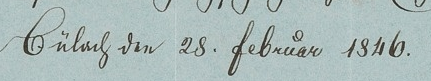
Bülach den 28. Februar 1846.
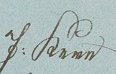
J. Kern
